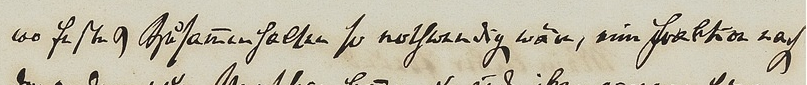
wo festes Zusammenhalten so nothwendig wäre, eine Fraktion nach
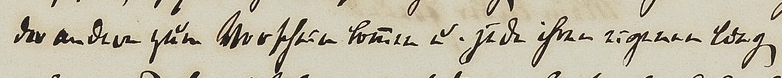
der andern zum Vorschein kommen u. jede ihren eigenen Weg
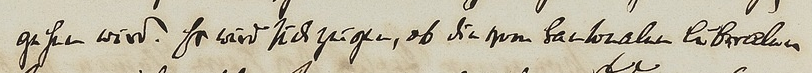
gehen wird. Es wird sich zeigen, ob die vom kantonalen liberalen
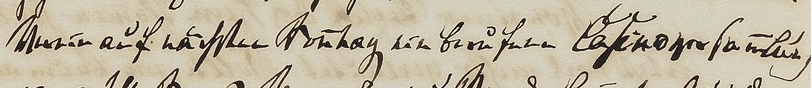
Verein auf nächsten Sonntag einberufene Casinoversammlung
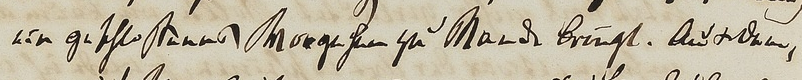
ein geschloßenes Vorgehen zu Stande bringt. Aus dem,
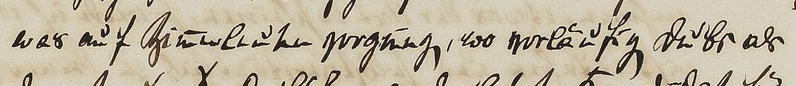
was auf Zimmerleuten vorgieng, wo vorläufig Dubs als
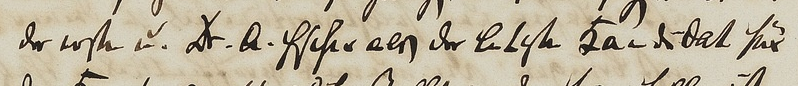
der erste u. Dr. A. Escher der letzte Kandidat für
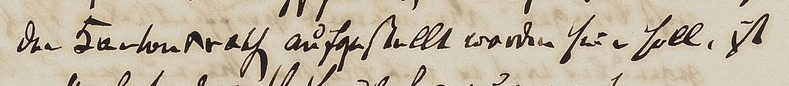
den Kantonsrath aufgestellt worden sein soll, ist
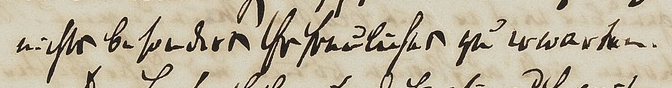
nichts besonders Erfreuliches zu erwarten.
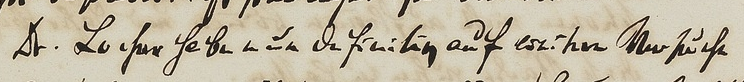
Dr. Locher habe nun definitiv auf weitere Versuche
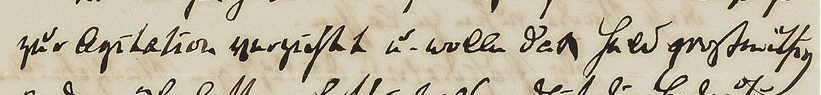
zur Agitation verzichtet u. wolle das Felde großmüthig
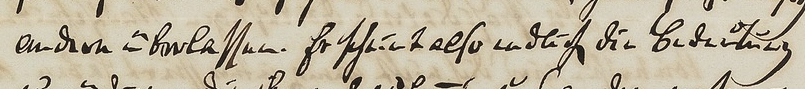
andern überlassen. Er scheint also endlich die Bedeutung
